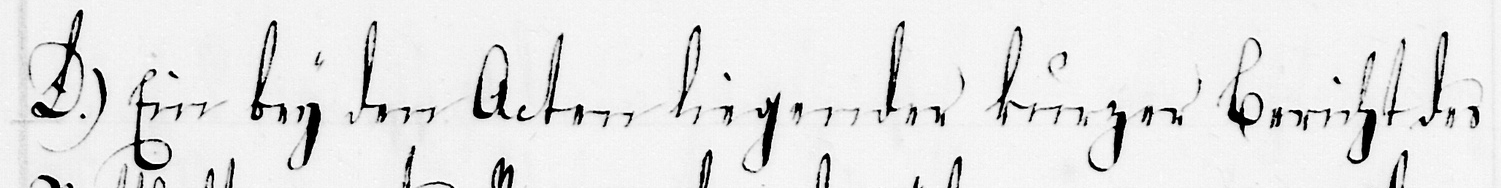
D.) Ein bey den Acten liegender kurzer Bericht des
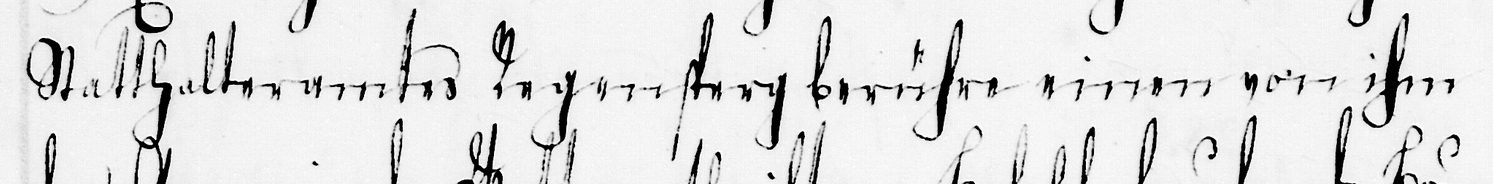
Statthalteramtes Regensperg berühre einen von ihm
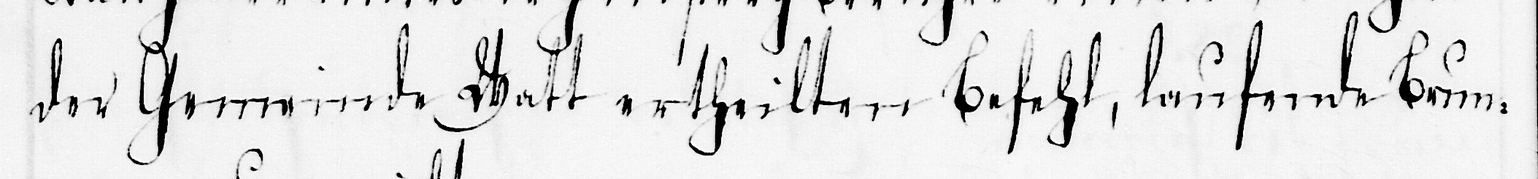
der Gemeinde Watt ertheilten Befehl, laufende Brun¬
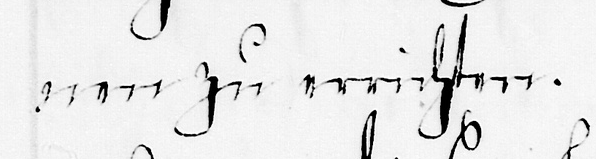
nen zu errichten.
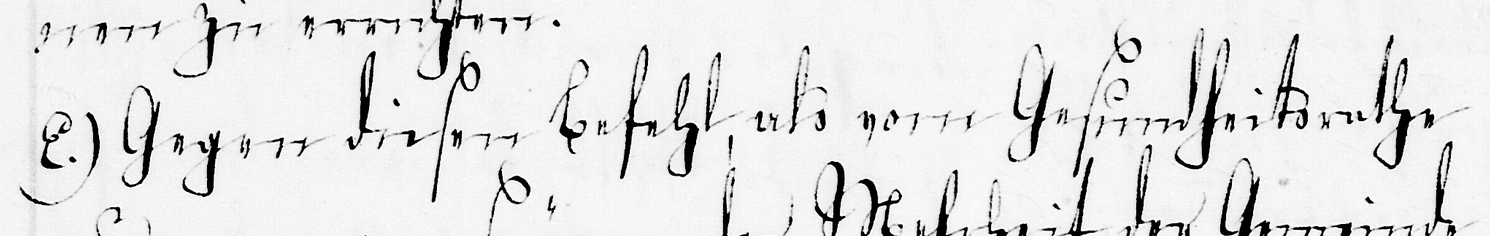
E.) Gegen diesen Befehl, als vom Gesundheitsrathe
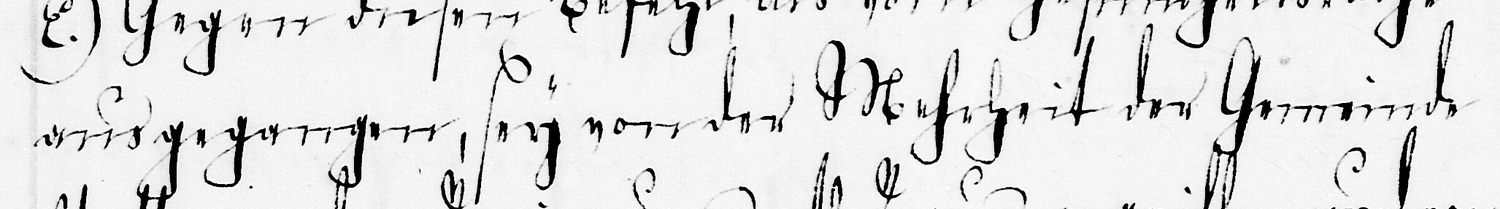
ausgegangen, sey von der Mehrheit der Gemeinde
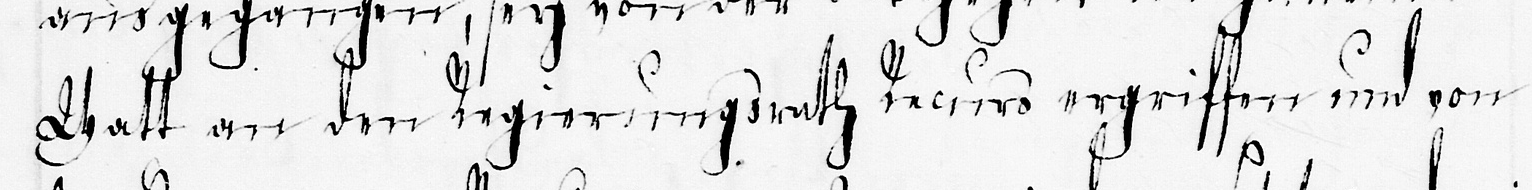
Watt an den Regierungsrath Recurs ergriffen und von
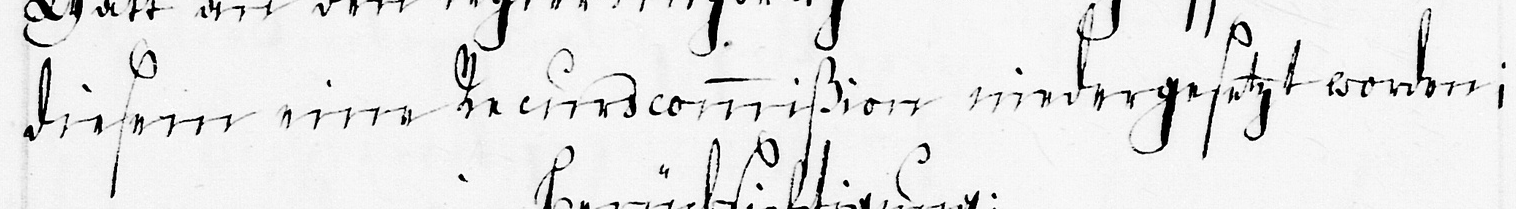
diesem eine Recurscommißion niedergesetzt worden;
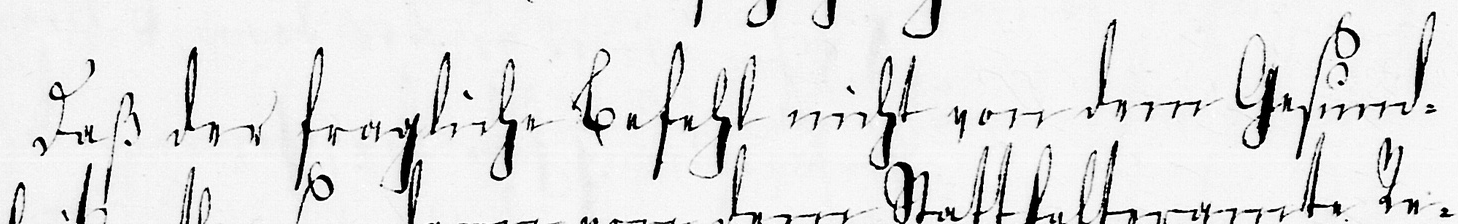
Daß der fragliche Befehl nicht von dem Gesund¬
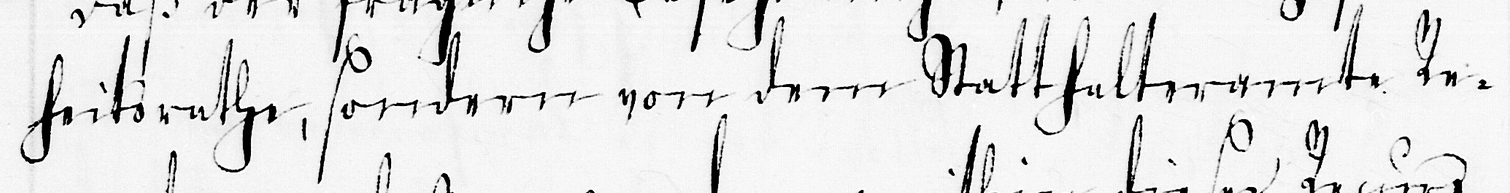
heitsrathe, sondern von dem Statthalteramte Re¬
